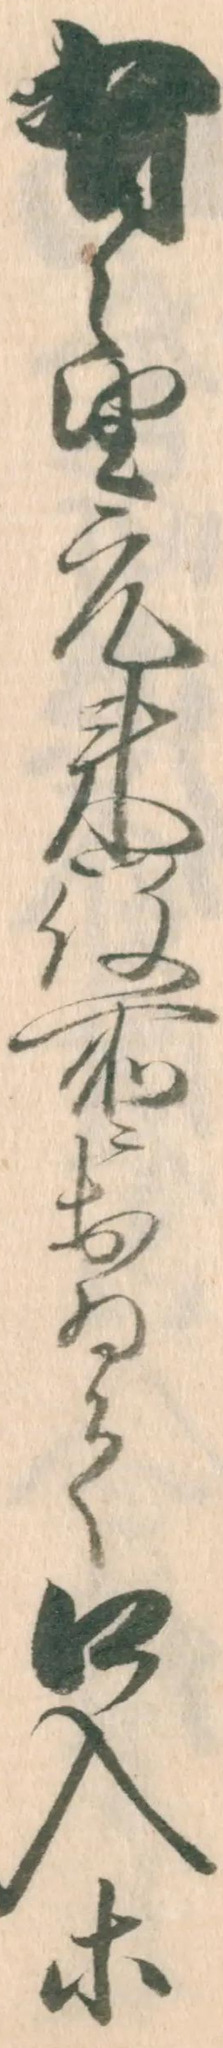有之由元来役所ニおゐて口入等
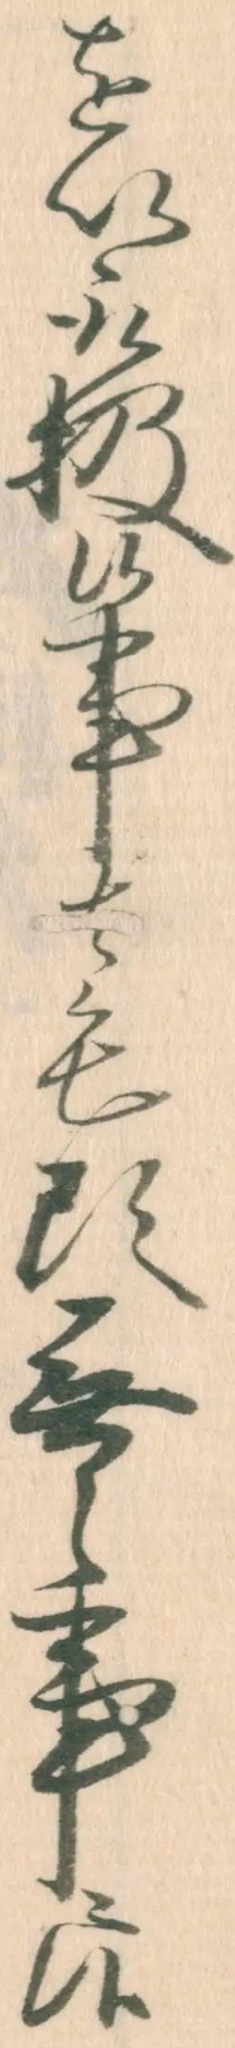を以取扱候事は毛頭無之事ニ候
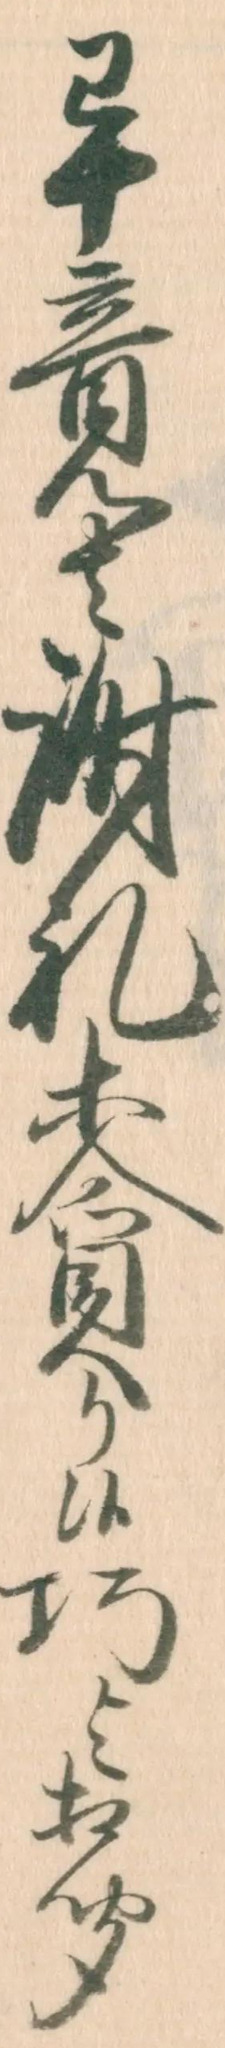畢竟は謝礼等貪り候巧と相聞
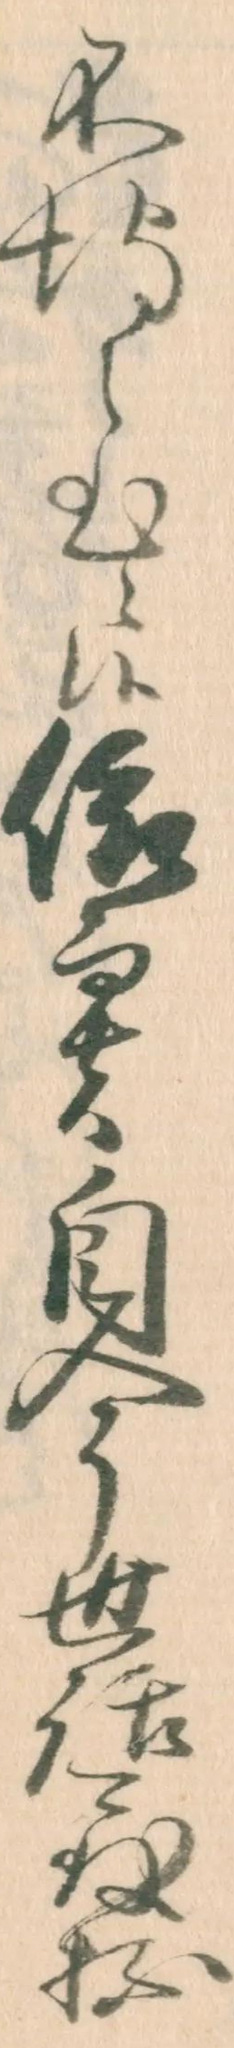不埒之至ニ候依ては自今世話致抔
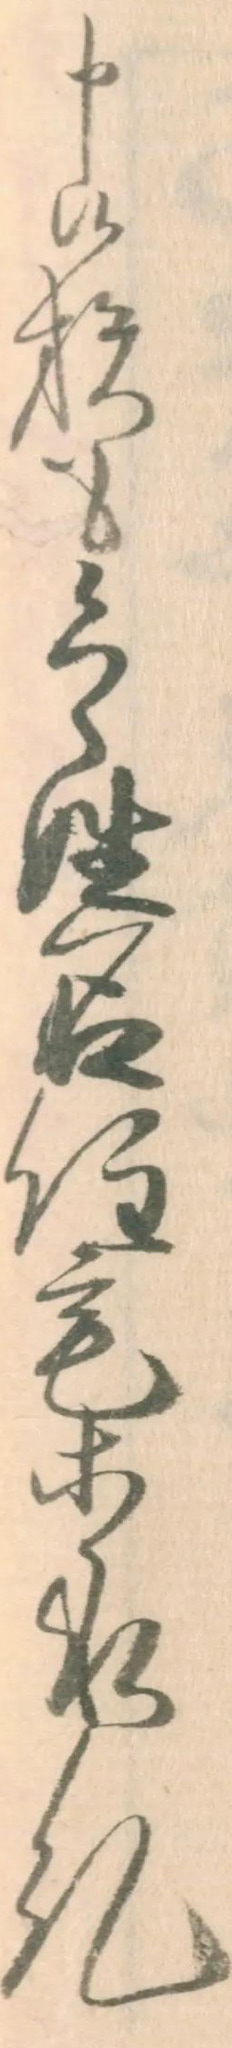申候族も候ハヽ姓名住宅等承糺
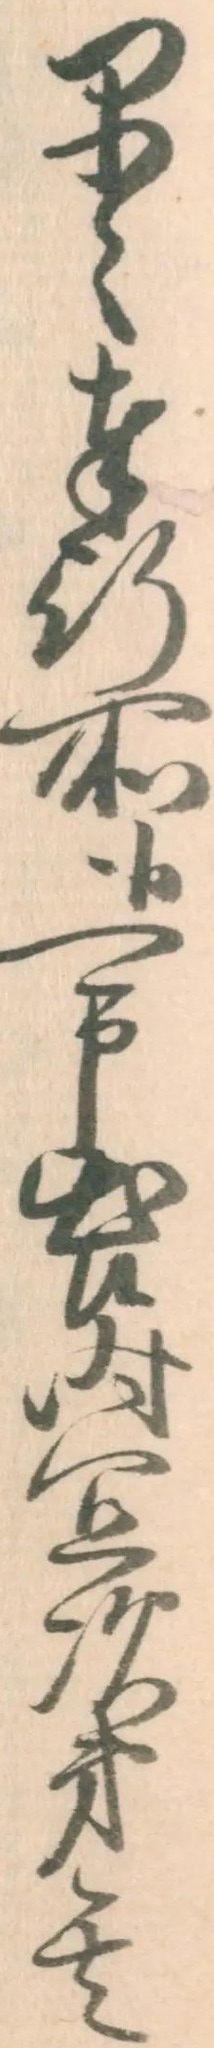早〻奉行所え可申出候時宜次第其
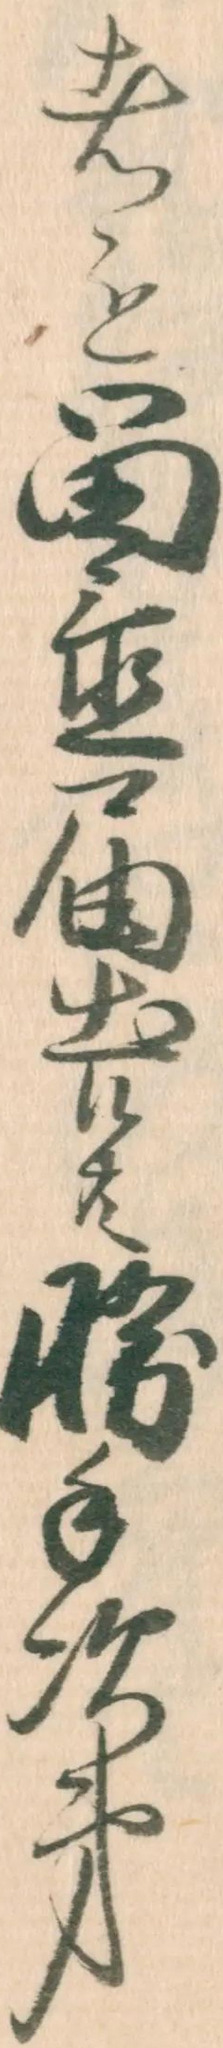者を畄置届出候共勝手次第
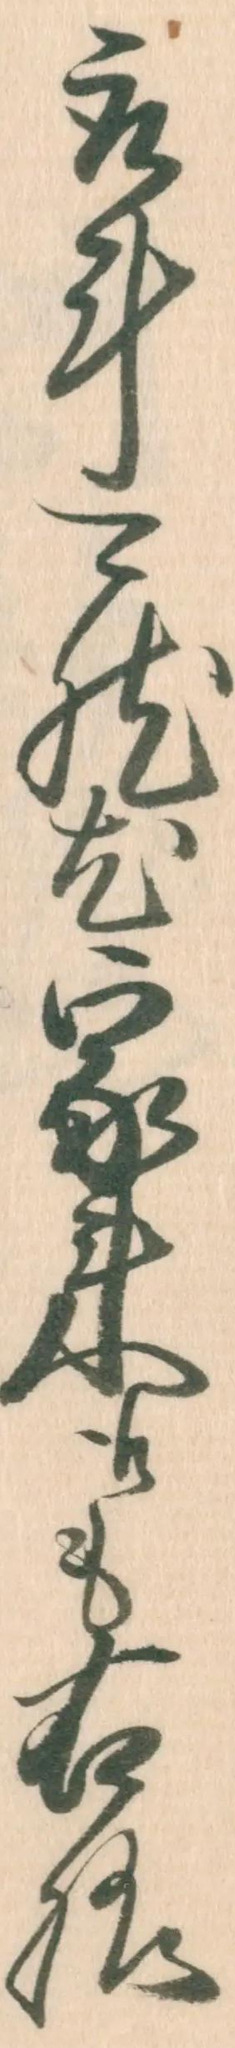取計可然尤家来えも右様
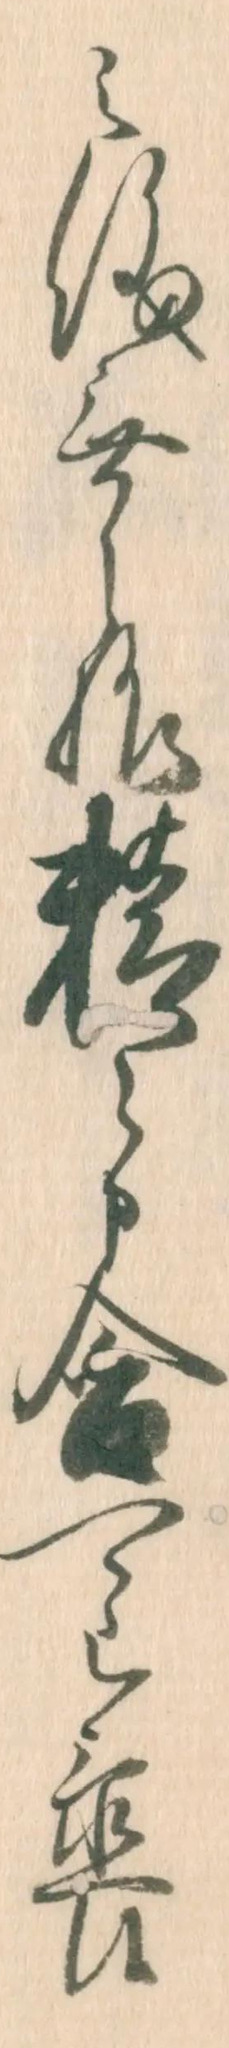之儀無之様精〻申含可被置候
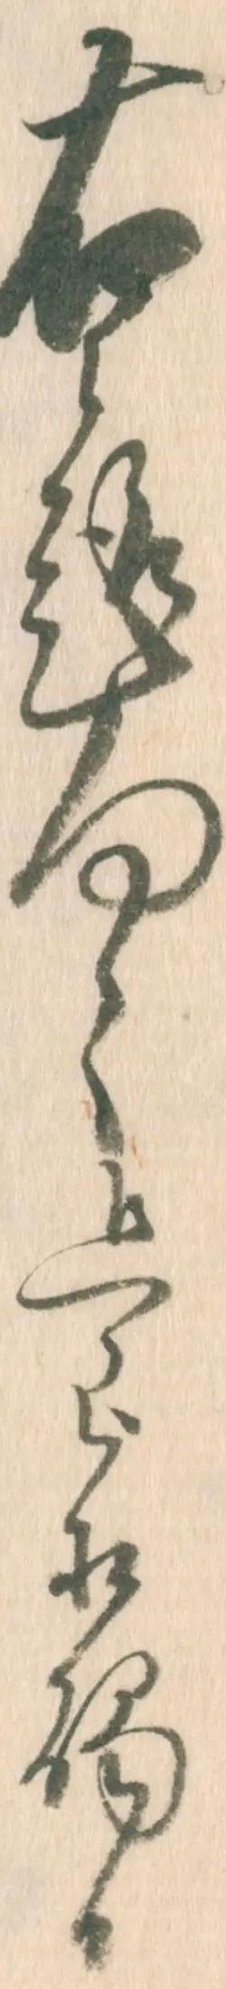右之趣向〻え可被相触候

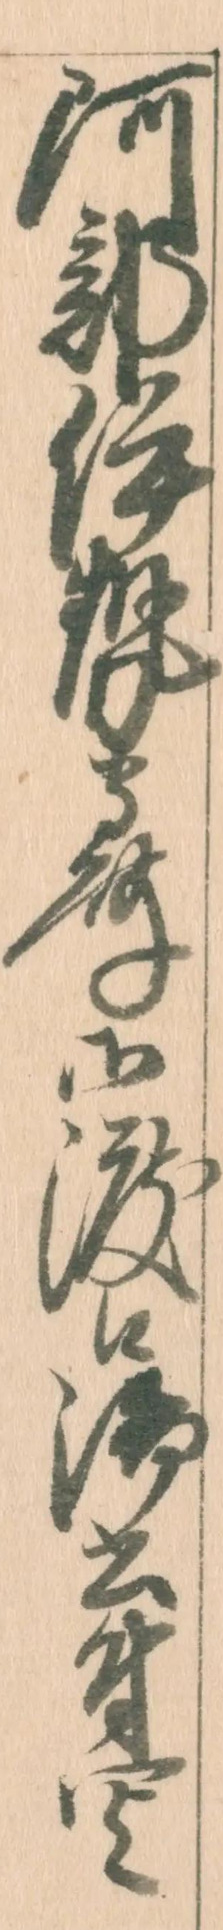│阿部伊勢守殿御渡候御書付写
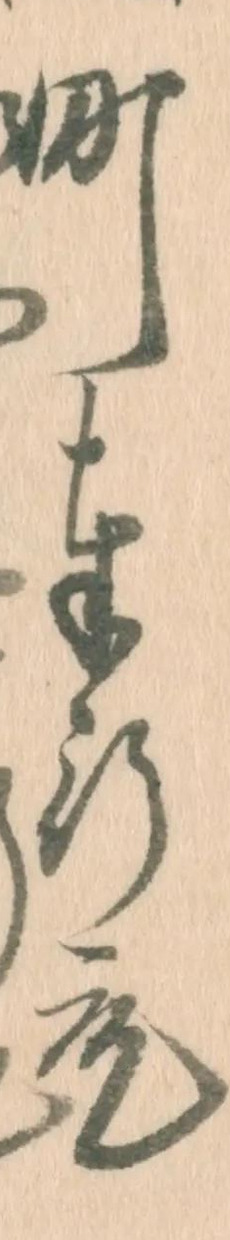││町奉行衆
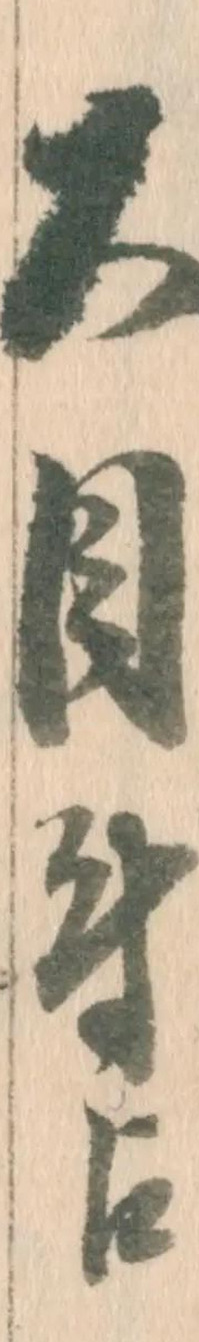│大目付え
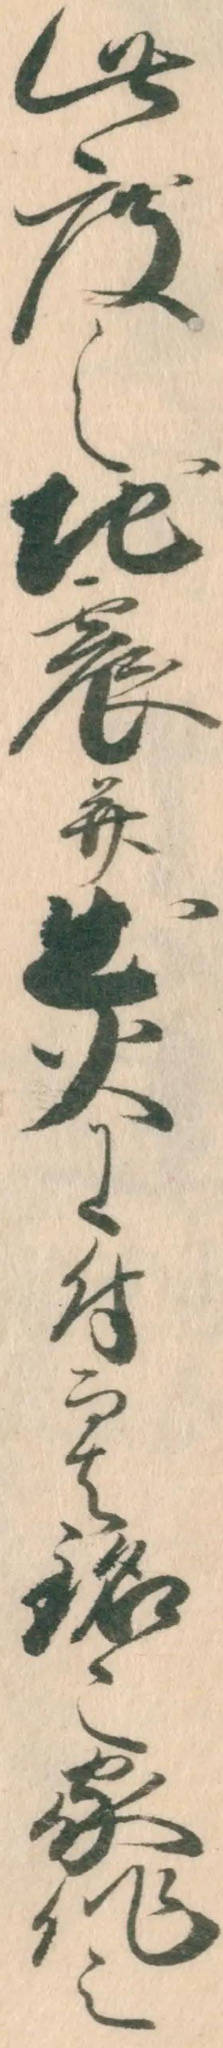此度之地震幷出火に付ては銘〻家作之
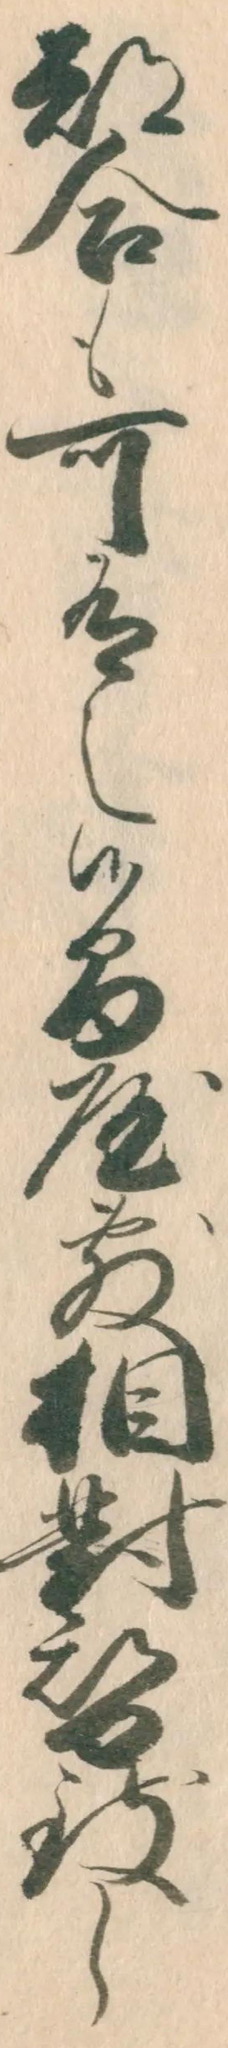都合も可有之候間屋敷相対替致し
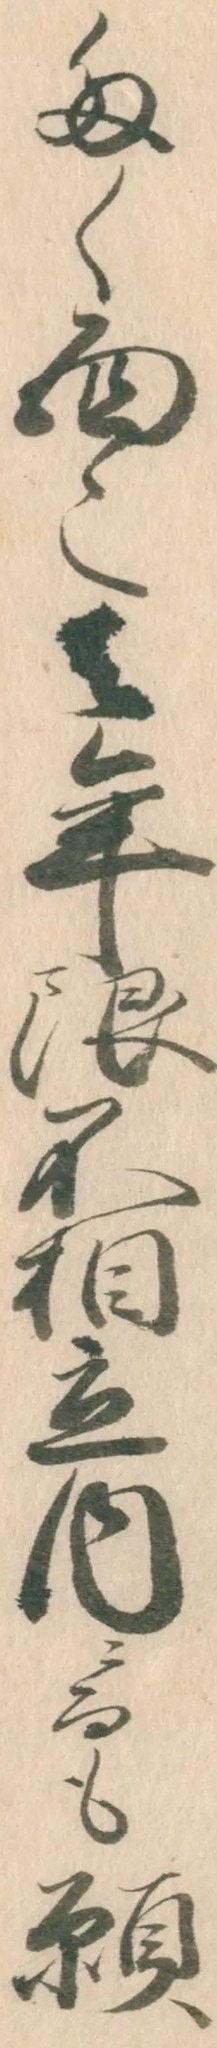たく面〻は年限不相立内ニても願
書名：地震災書留 2巻. [2] 内表紙に「地震一件　安政二卯年十月」とあり
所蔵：国立国会図書館 National Diet Library, JAPAN
